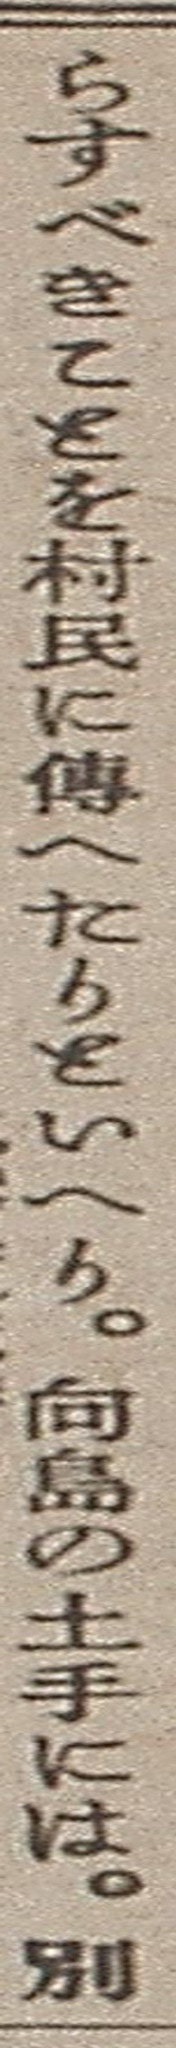らすべきことを村民に伝へたりといへり。向島の土手には。別
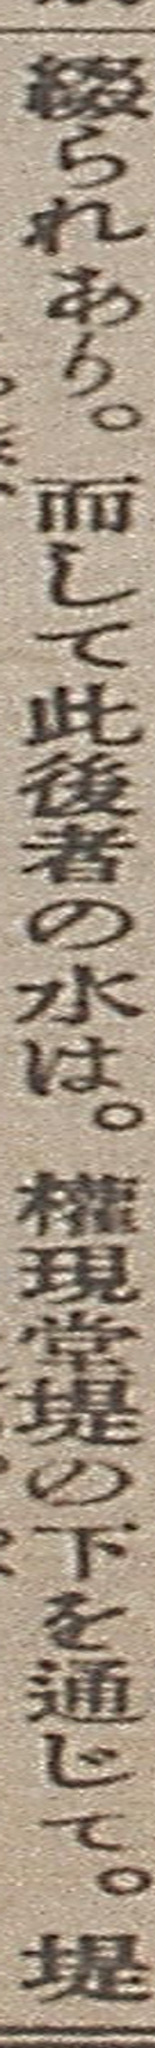綴られあり。而して此後者の水は。権現堂堤の下を通じて。堤
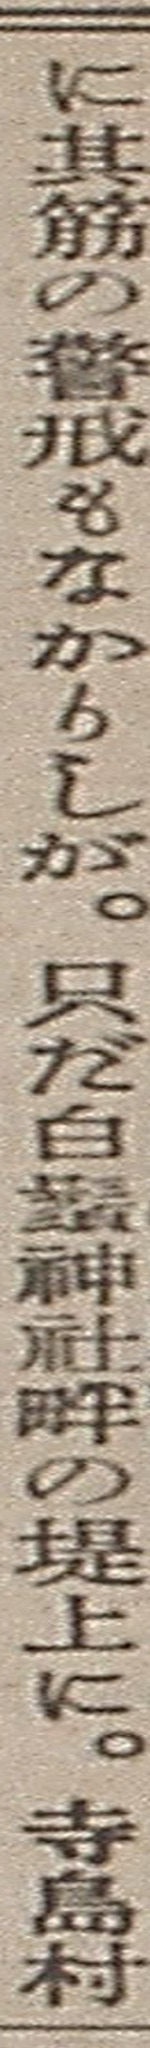に其筋の警戒もなかりしが。只だ白鬚神社畔の堤上に。寺島村
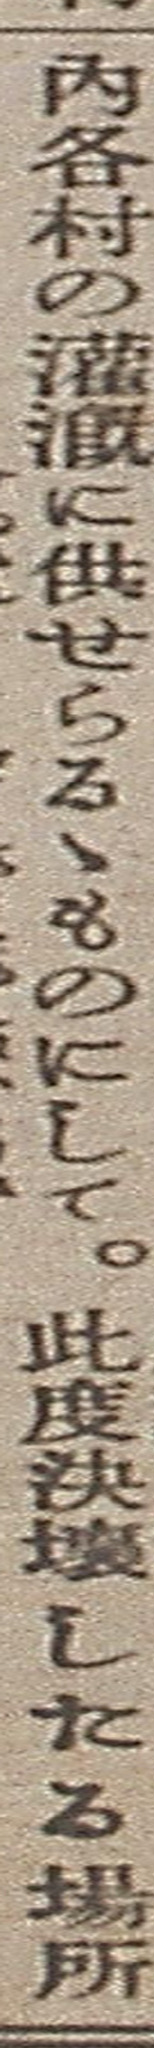内各村の灌漑に供せらるゝものにして。此度決壊したる場所
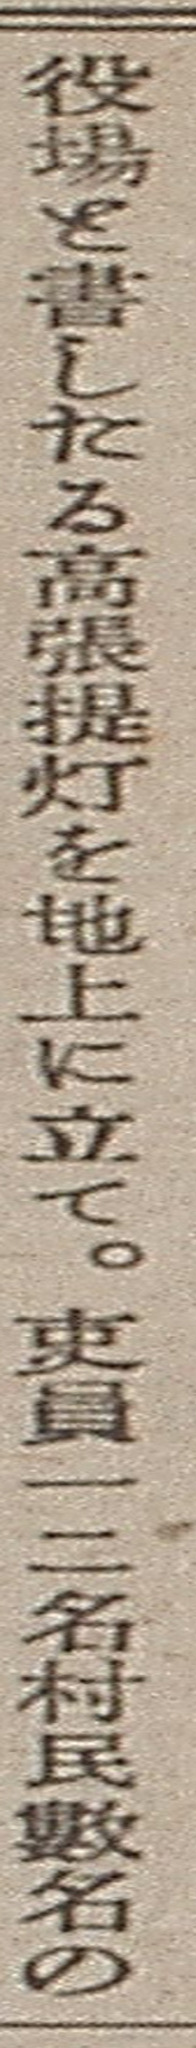役場と書したる高張提灯を地上に立て。吏員一ニ名村民数名の
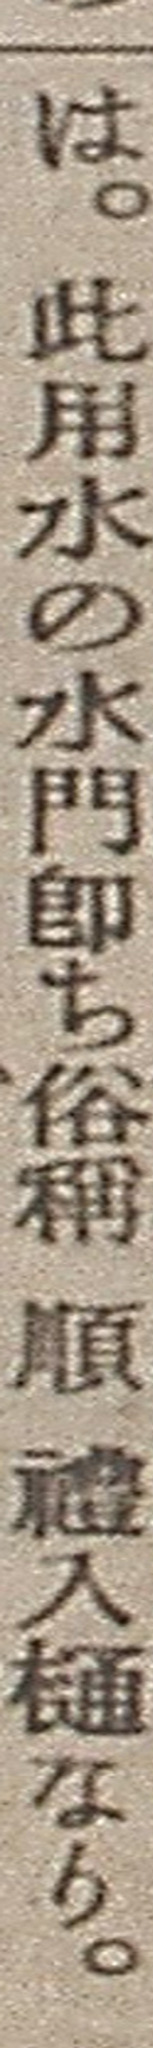は。此用水の水門即ち俗称順禮入樋なり。
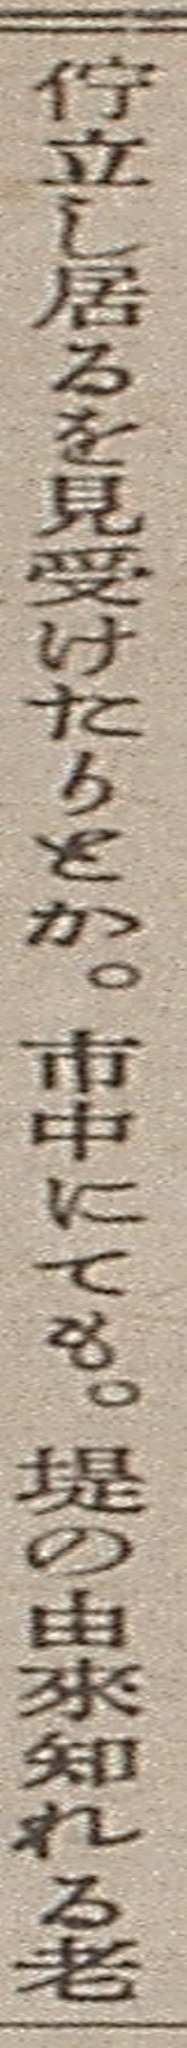佇立し居るを見受けたりとか。市中にても。堤の由来知れる老
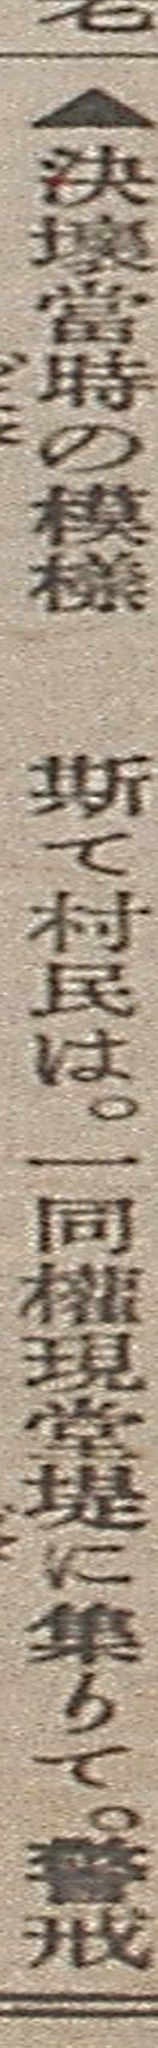▲決壊当時の模様斯て村民は。一同権現堂堤に集りて。警戒
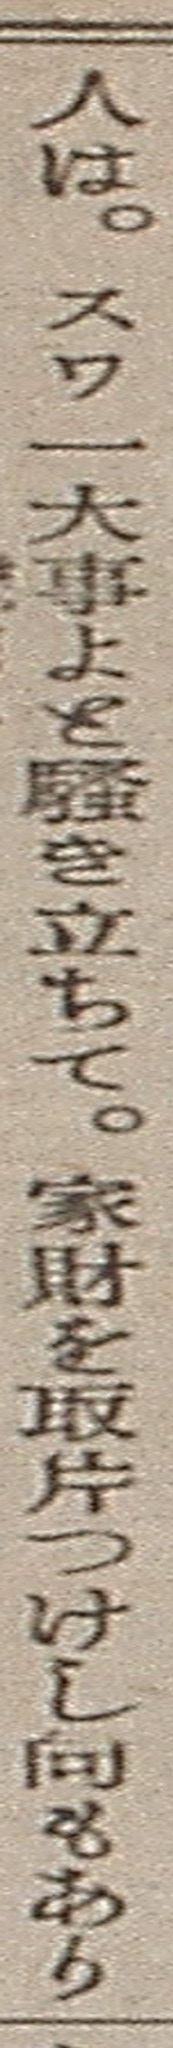人は。スワ一大事よと騒き立ちて。家財を取片つけし向もあり
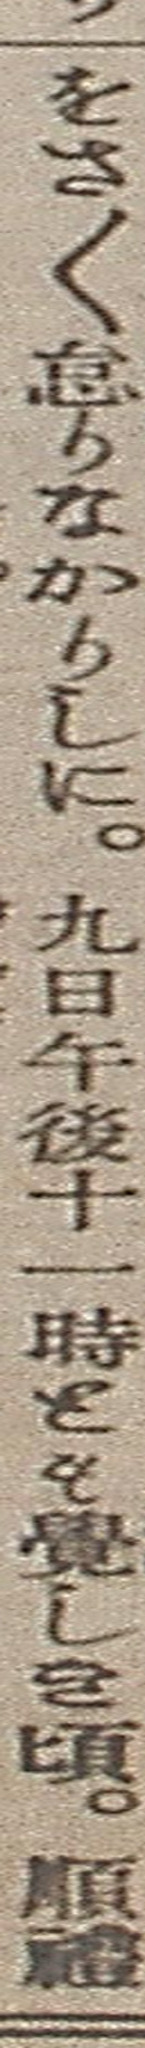をさ〳〵怠りなかりしに。九日午後十一時とも覚しき頃。順禮
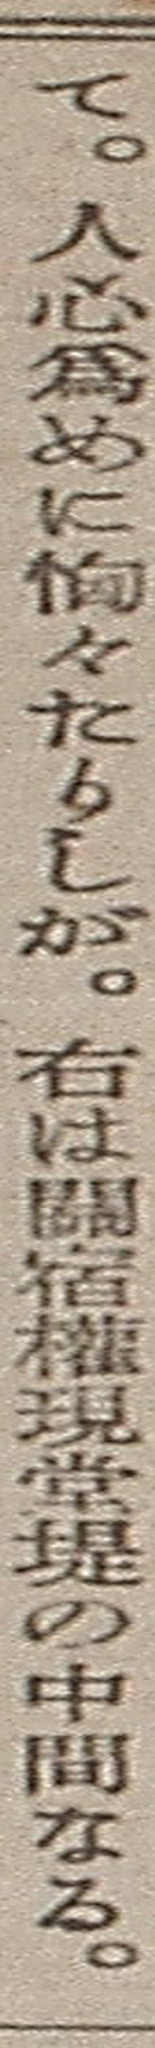て。人心為めに恟々たりしが。右は関宿権現堂堤の中間なる。
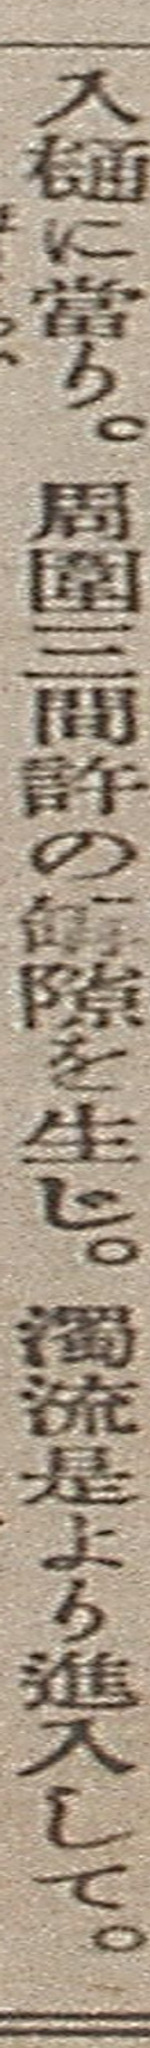入樋に当り。周囲三間許の罅隙を生じ。濁流是より進入して。
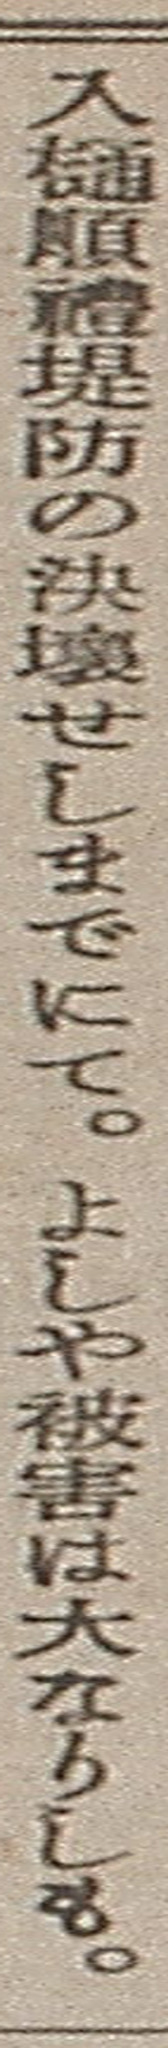入樋順禮堤防の決壊せしまでにて。よしや被害は大なりしも。
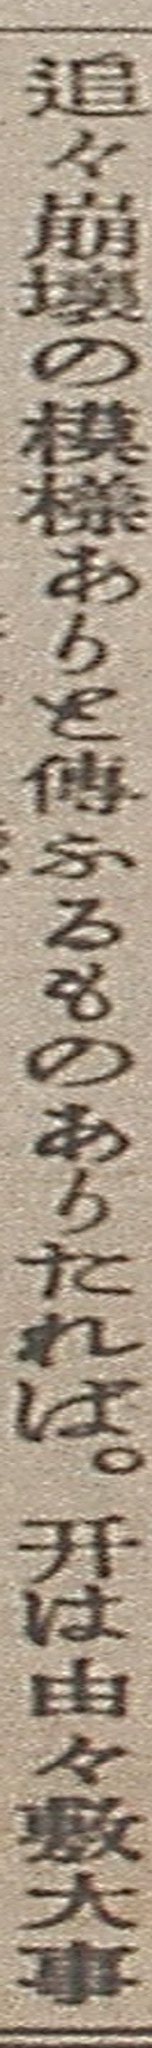追々崩壊の模様ありと伝ふるものありたれば。其は由々敷大事
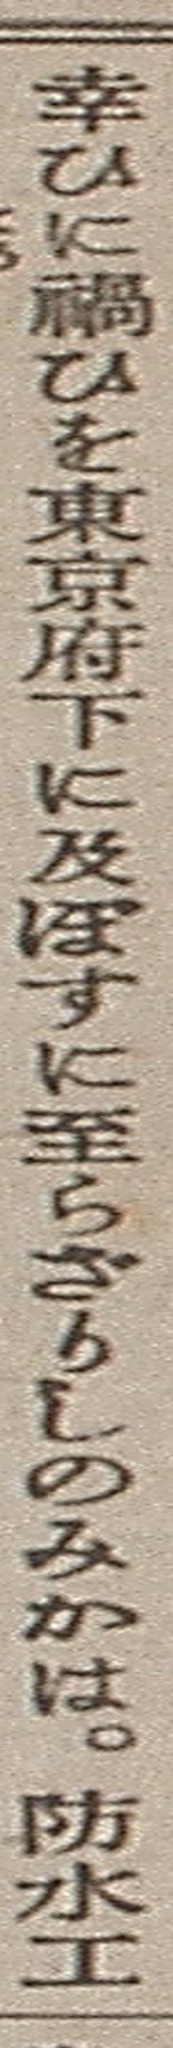幸ひに禍ひを東京府下に及ぼすに至らざりしのみかは。防水工
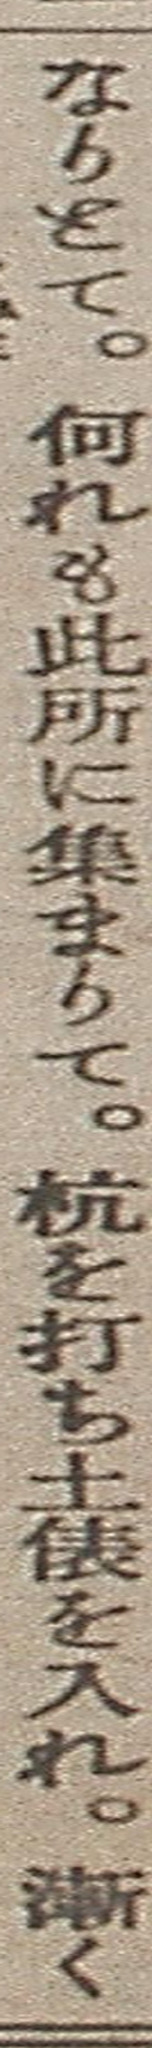なりとて。何れも此所に集まりて。杭を打ち土俵を入れ。漸く
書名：風俗畫報臨時増刊第百九十九號　明治三十二年十月各地災害圖會（前編之續）
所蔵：東京大学地震研究所図書室 Earthquake Research Institute Library, The University of Tokyo, JAPAN
